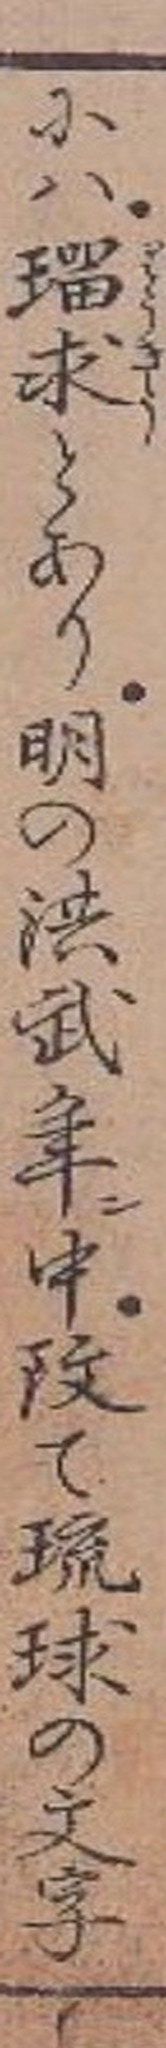には、瑠求とあり、明の洪武年中、改て琉球の文字
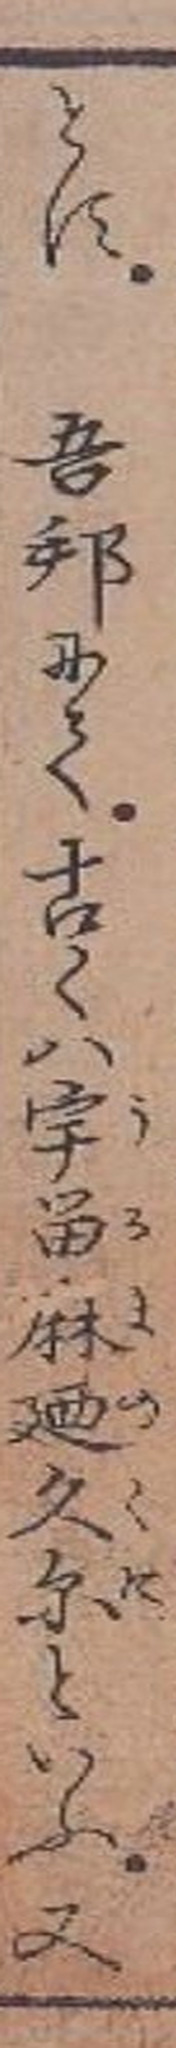とす、吾邦にて、古くは宇留麻廼久爾といふ、又

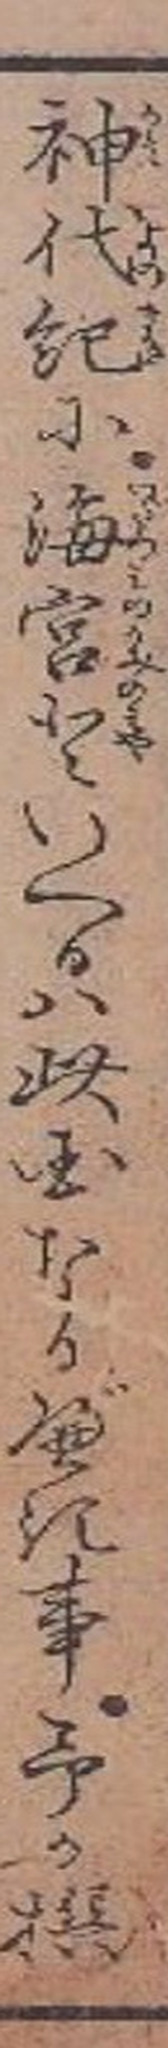神代紀に、海宮といへるは此国なるべき事、予か撰
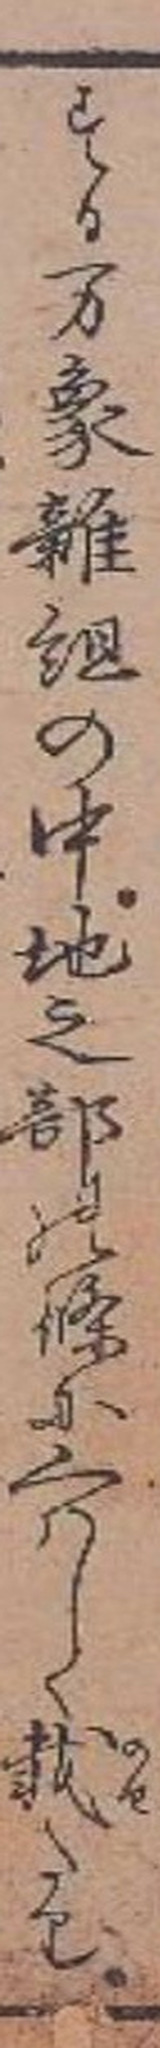する万象雑組の中、地之部の条にくはしく載たり、
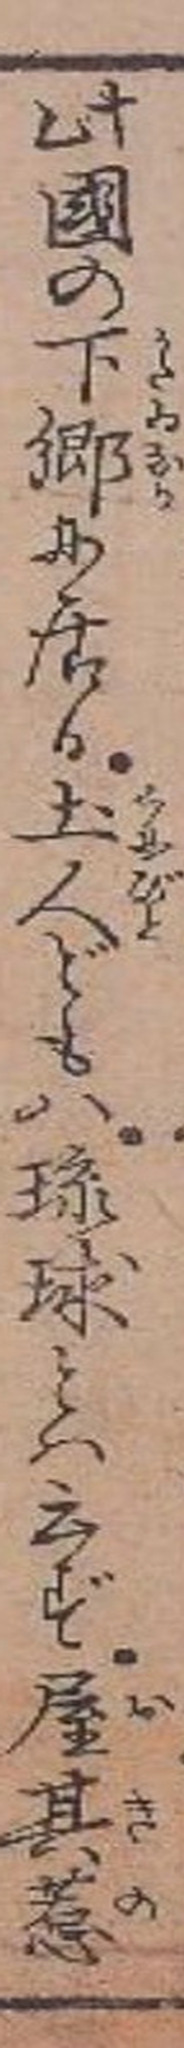此国の下郷に居る、土人どもは、琉球とは云ず、屋其惹
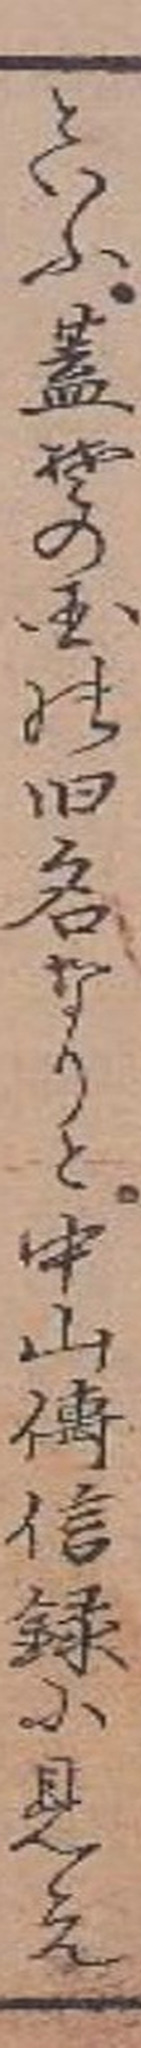といふ、蓋その国の旧名なりと、中山伝信録に見え
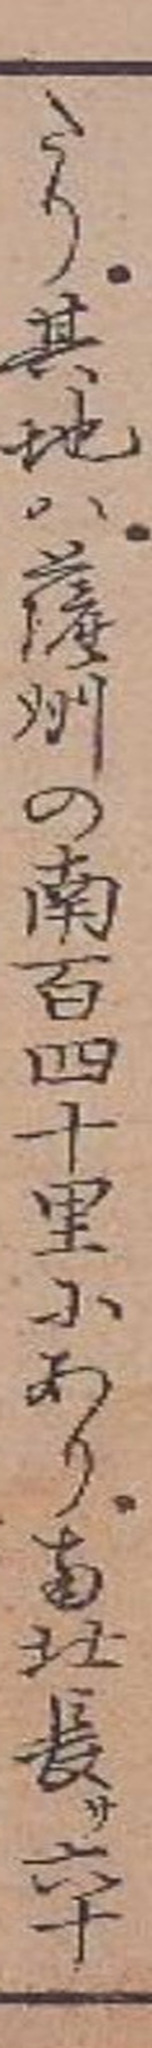たり、其地は、薩州の南百四十里にあり、南北長サ六十
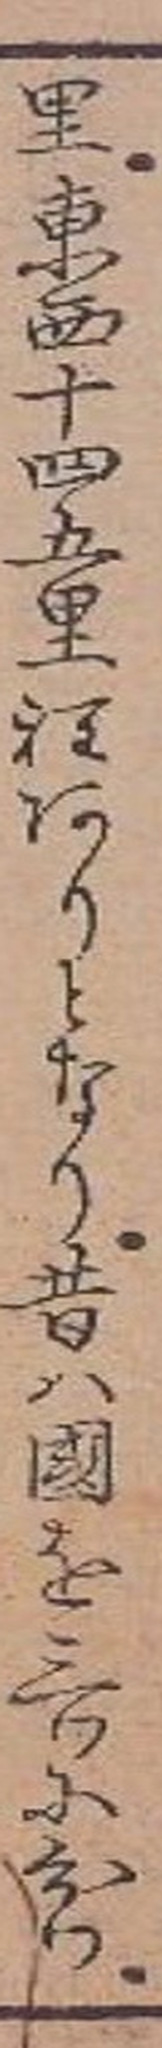里、東西十四五里程ありとなり、昔は国を三つに分つ、
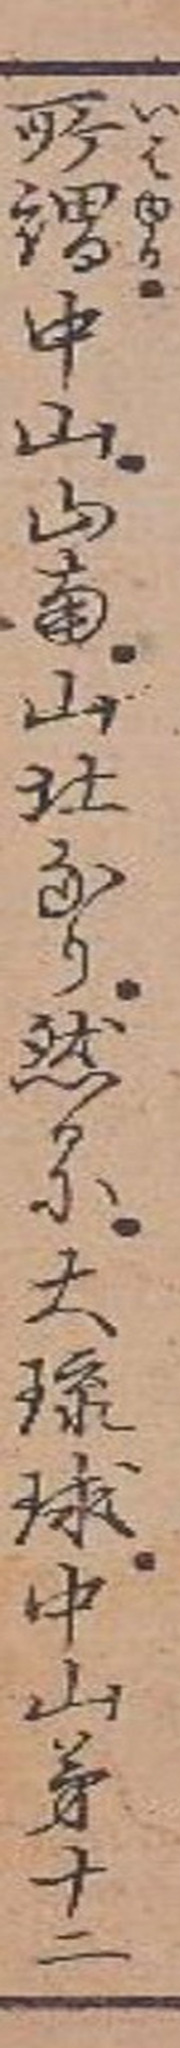所謂、中山、山南、山北なり、然るに、大琉球、中山第十二
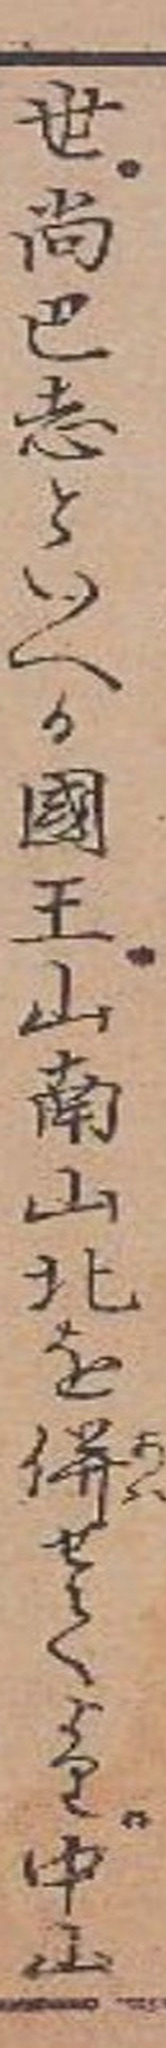世、尚巴志といへる国王、山南山北を併せてより、中山
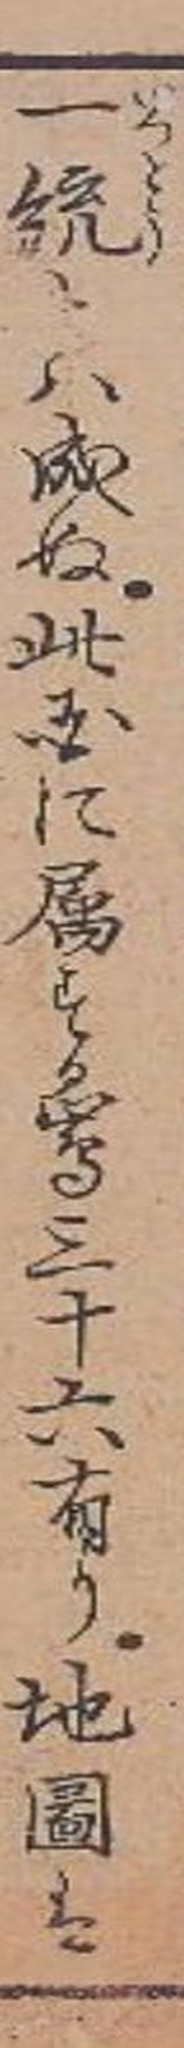一統とは成ぬ、此国に属する島三十六有り、地図は
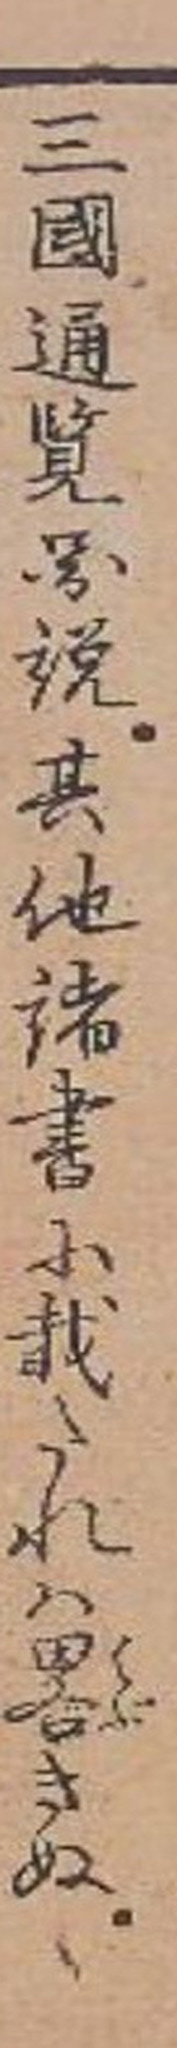三国通覧図説、其他諸書に載たれは略きぬ、
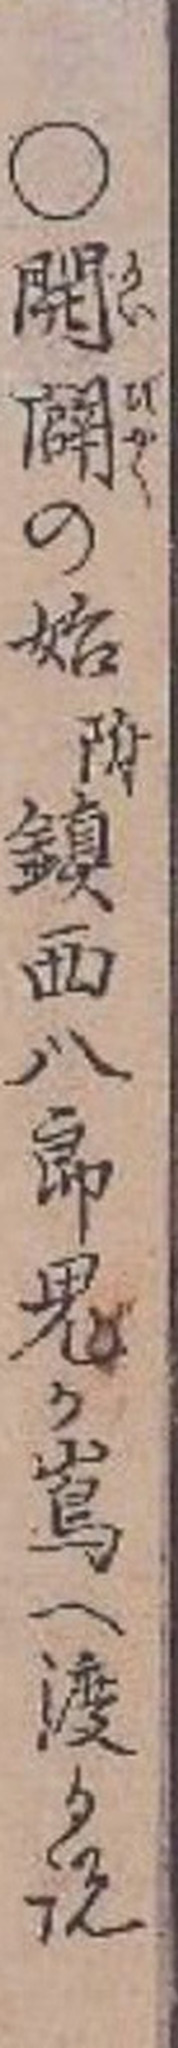○開闢の始附鎮西八郎鬼か島へ渡る説
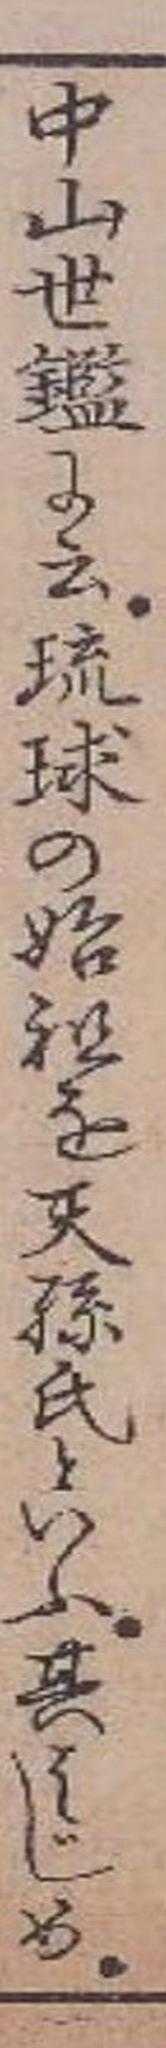中山世鑑に云、琉球の始祖を天孫氏といふ、其はじめ、
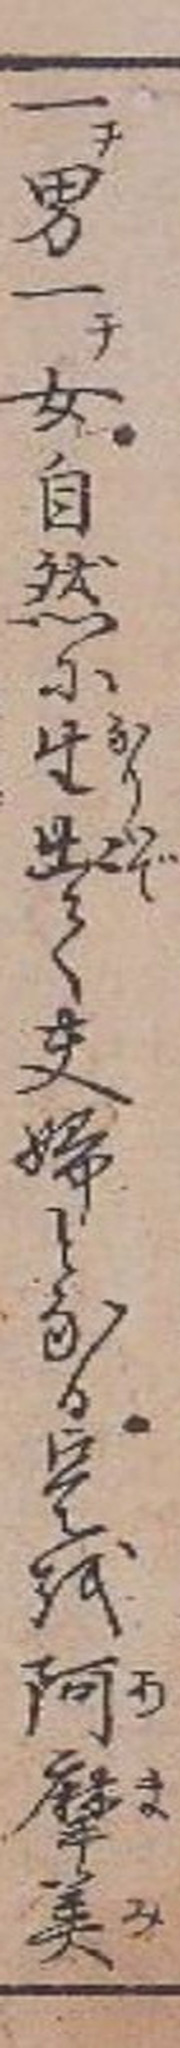一チ男一チ女、自然に生出て夫婦となる、是を阿摩美
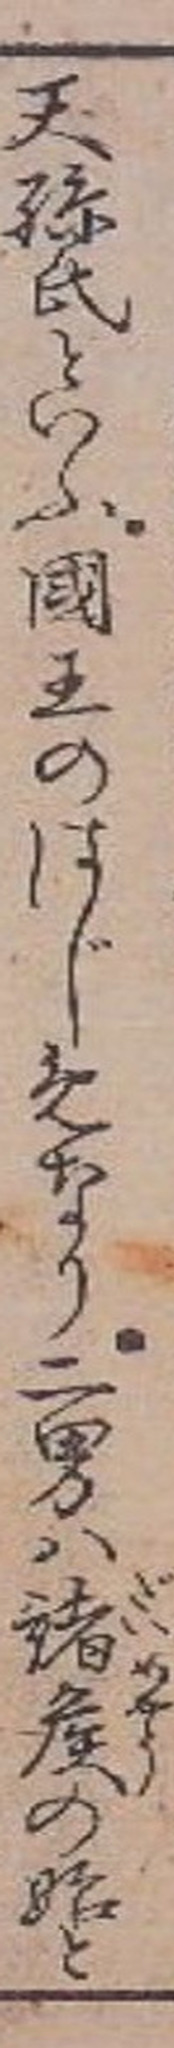天孫氏といふ、国王のはじめなり、二男は諸侯の始と
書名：琉球談
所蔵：University of the Ryukyus Library
